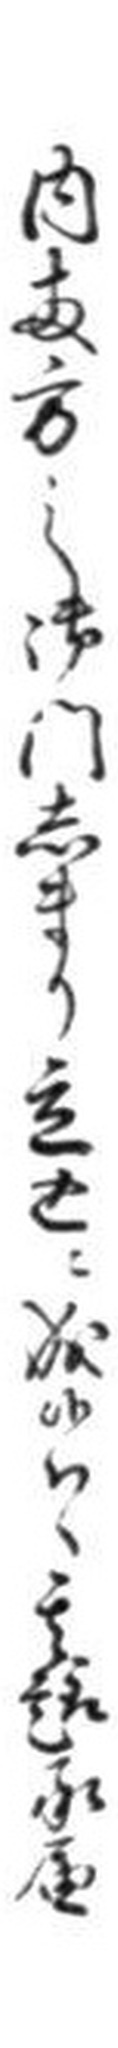内両方之御門しまり立込ニ成候ハヽ其趣承届
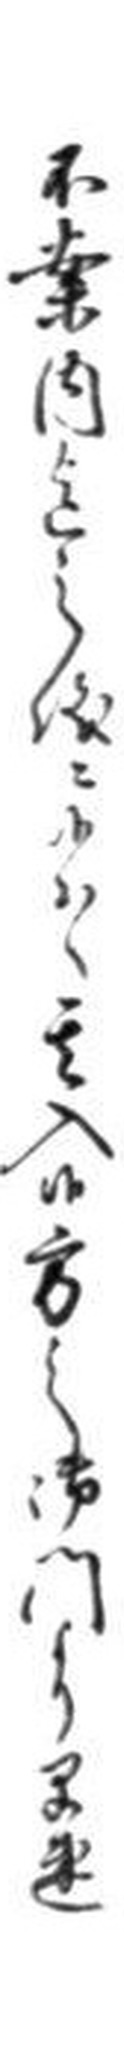不案内迄之儀ニ候ハヽ其入候方之御門より早速
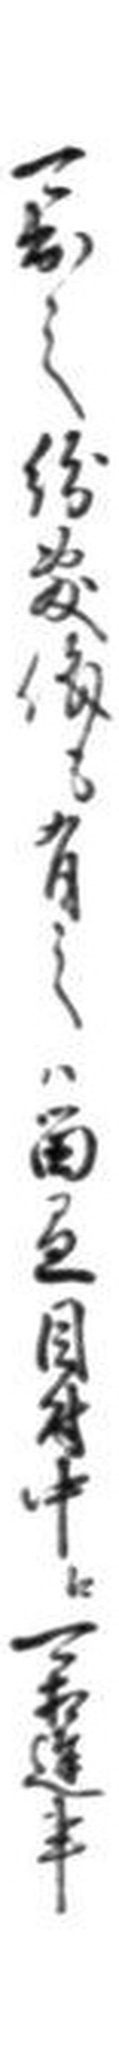可出之紛敷儀も有之ハ留置目付中江可相達事
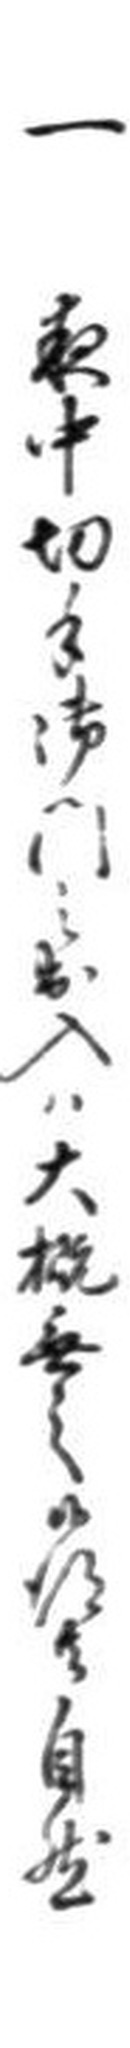一夜中切手御門之出入ハ大概無之候得共自然
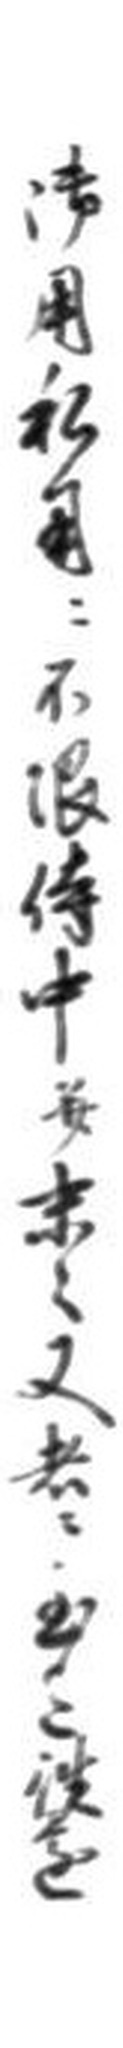御用私用ニ不限侍中并末々又者ニ至迄往還
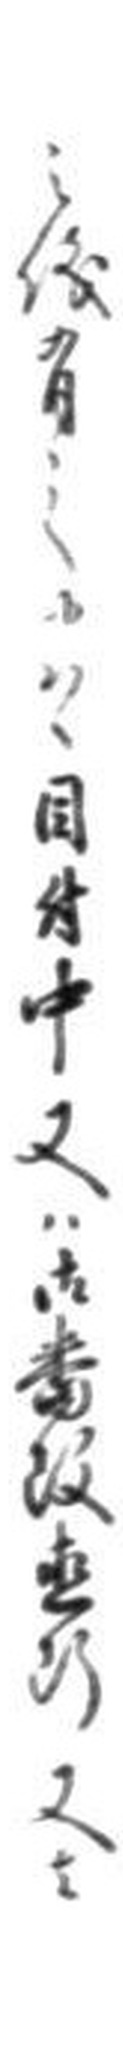之儀有之候ハヽ目付中又ハ御番改直断又者
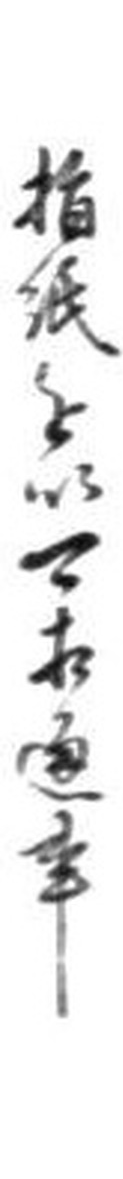指紙を以可相通事
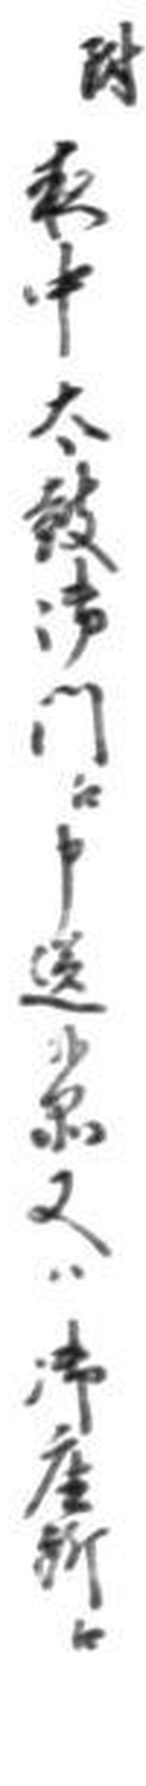夜中太鼓御門江申送候品又ハ御座所江
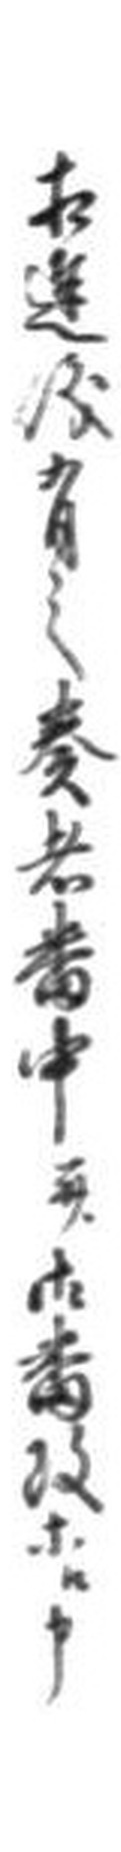相達儀有之奏者番中并御番改等江申
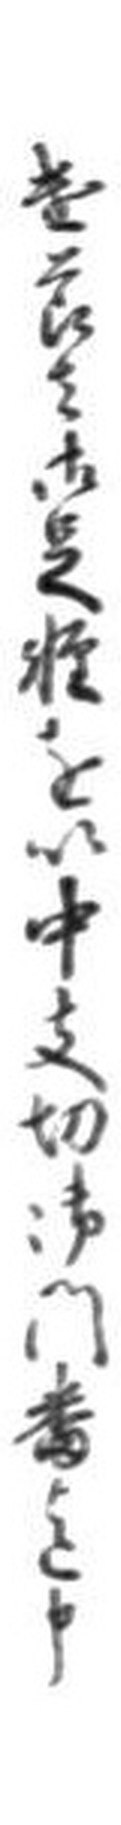遣節者御足軽を以中支切御門番迄申
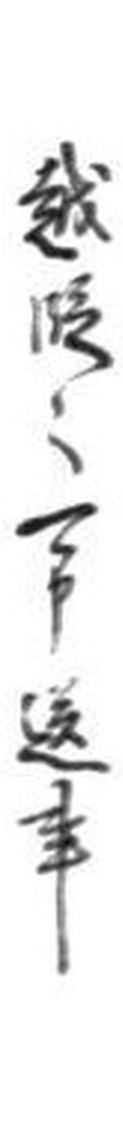越段々可申送事
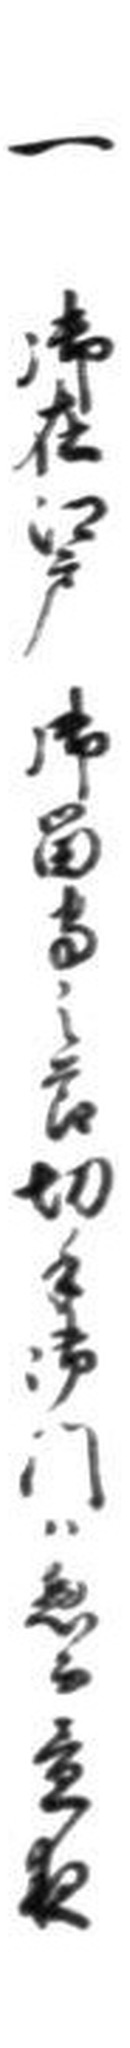一御在江戸御留守之節切手御門ハ惣而昼夜

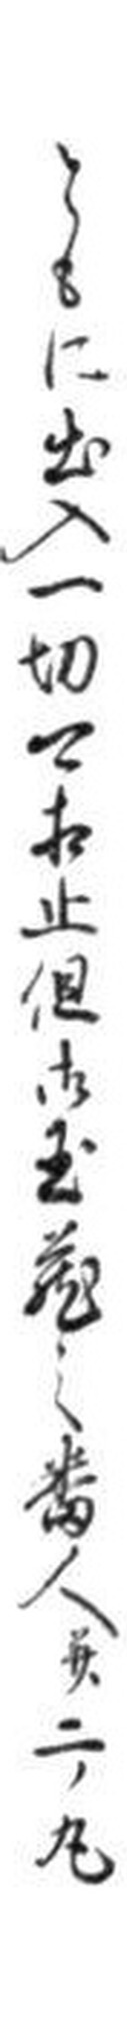ともに出入一切相止但御玉蔵之番人并二ノ丸
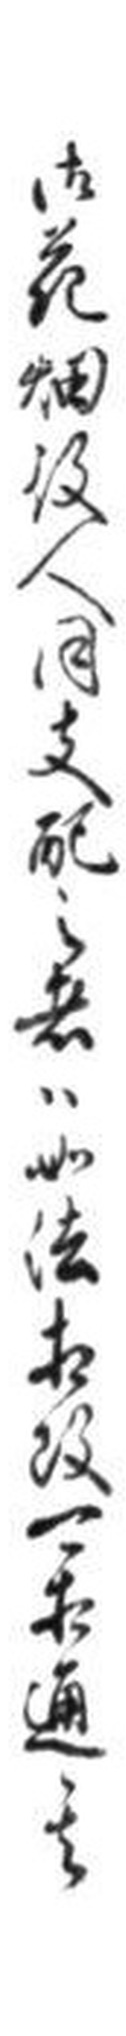御花畑役人同支配之者ハ如法相改可相通其
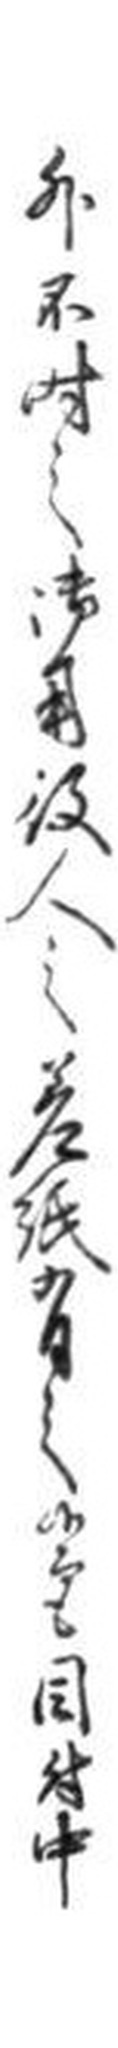外不時之御用役人之差紙有之候而も目付中
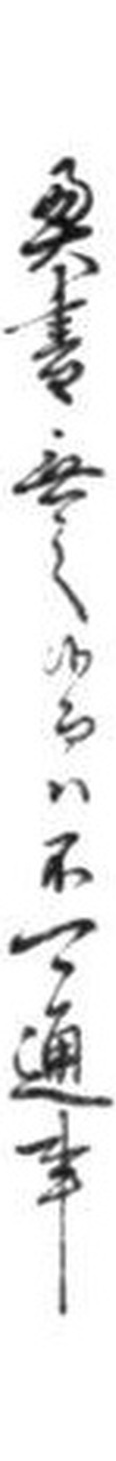奥書無之候而ハ不可通事
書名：家譜 三十三 吉邦公 享保四年
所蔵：福井県文書館 Fukui Prefectural Archives
